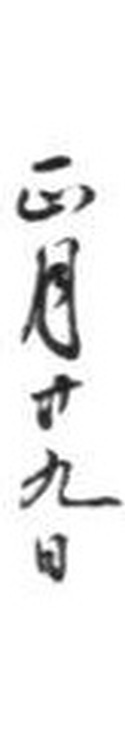正月廿九日
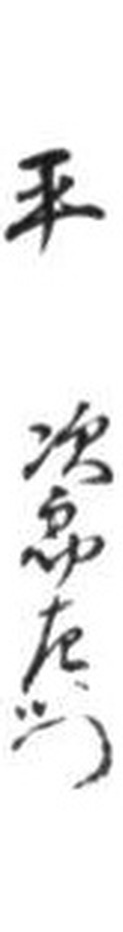平次郎左衛門
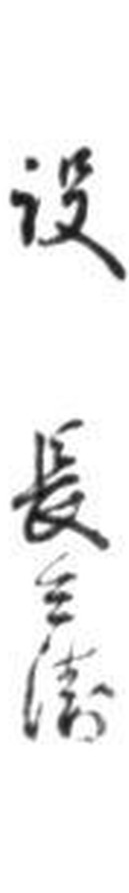設長兵衛
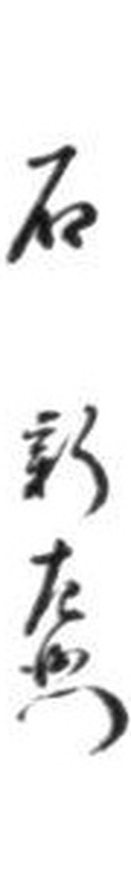石新左衛門
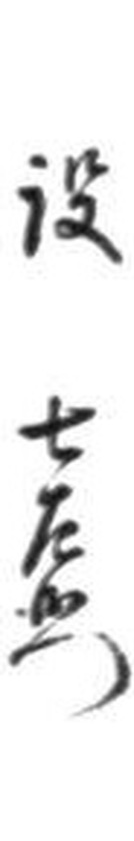設七左衛門
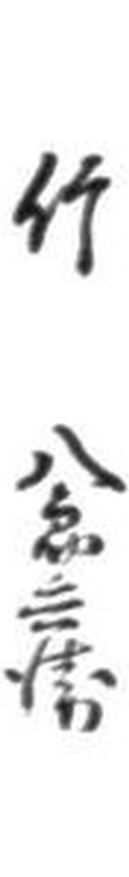竹八郎兵衛
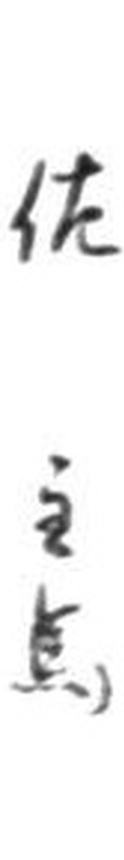佐主馬
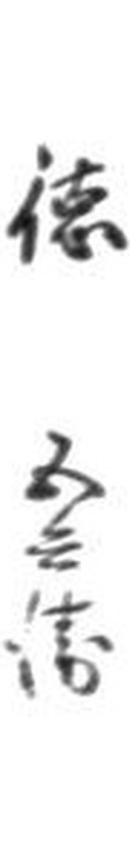徳五兵衛
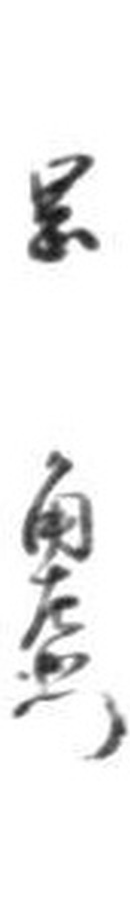岡角左衛門
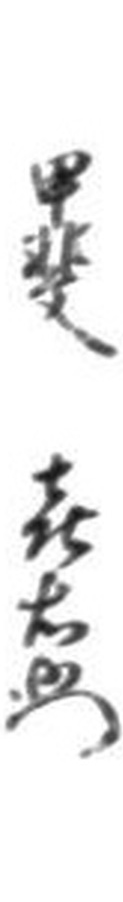甲斐喜右衛門
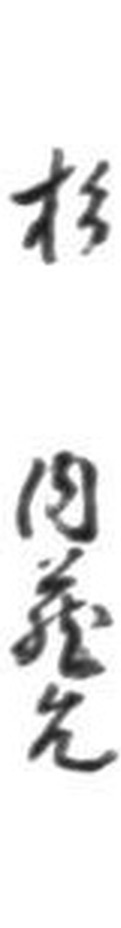杉内蔵允
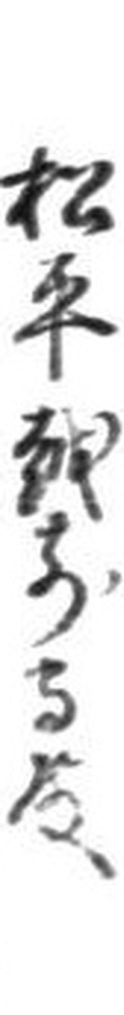松平越前守殿

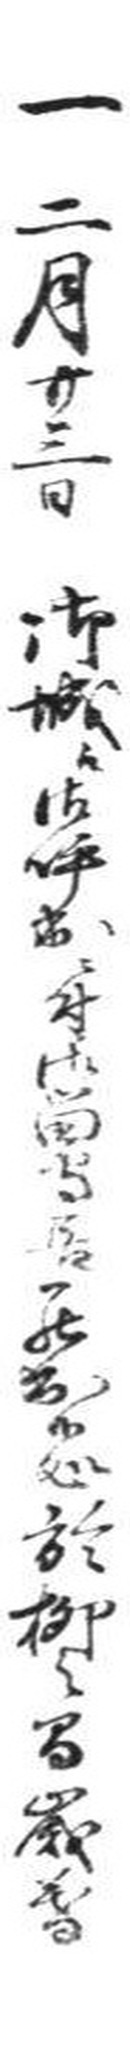一二月廿三日御城江御呼出ニ付御留守居罷出候処於柳之間歳暮
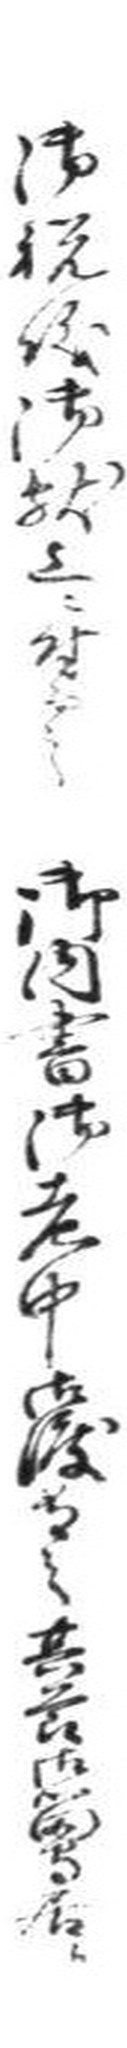御祝儀御献上ニ付而之御内書御老中御渡有之其節御留守居江
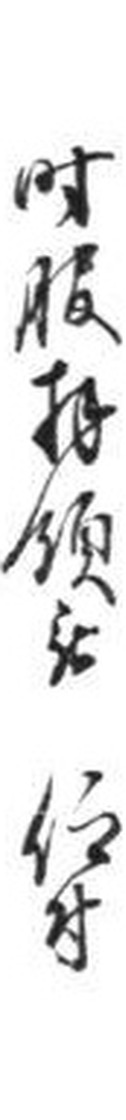時服拝領被仰付
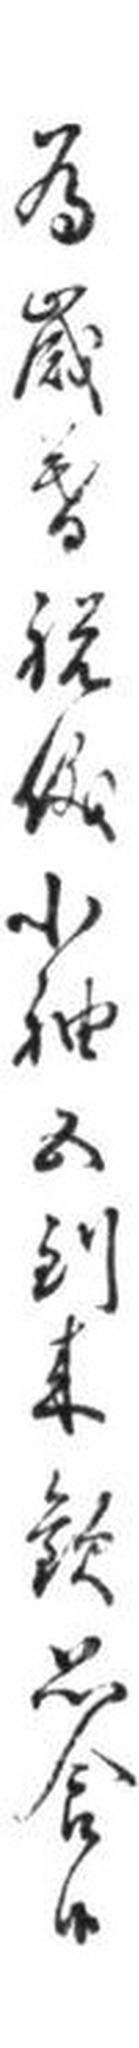為歳暮祝儀小袖五到来歓思食候
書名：家譜 十三 綱昌公 従寛文元年到延宝五年
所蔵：福井県文書館 Fukui Prefectural Archives
